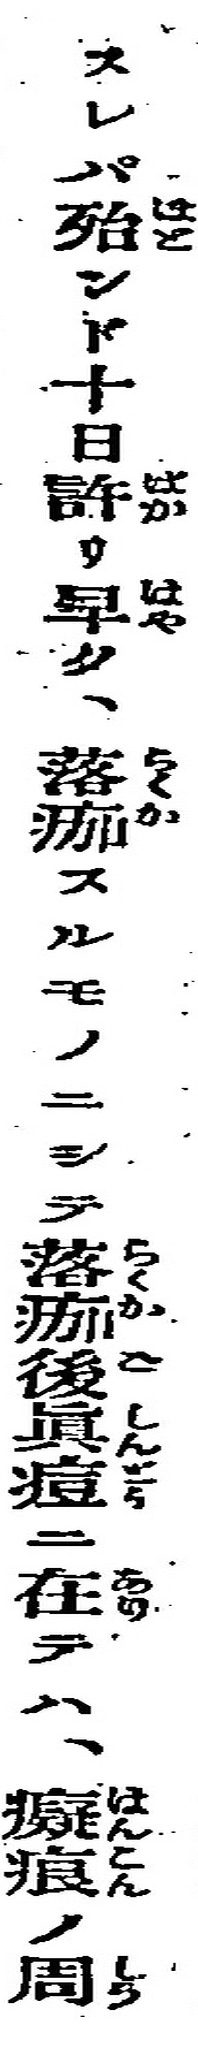スレパ殆ンド十日許リ早ク、落痂スルモノニシテ落痂後真痘ニ在テハ、癡痕ノ周
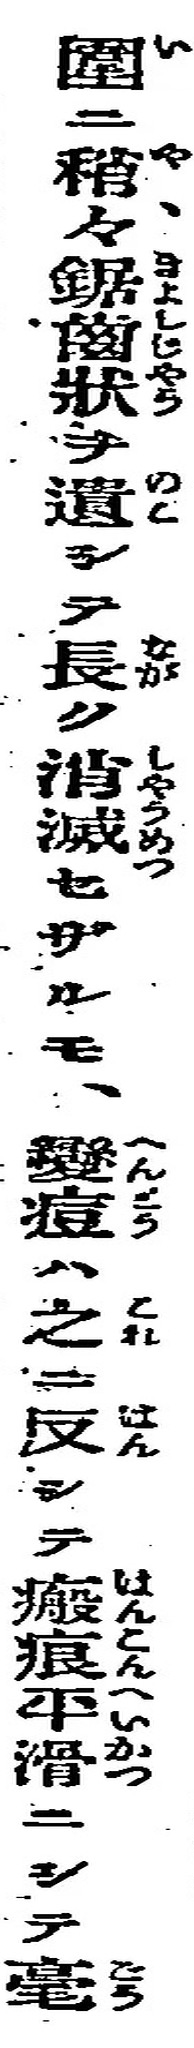囲ニ稍々鋸歯状ヲ遺シテ長ク消滅セザルモ、変痘ハ之ニ反シテ瘢痕平滑ニシテ毫
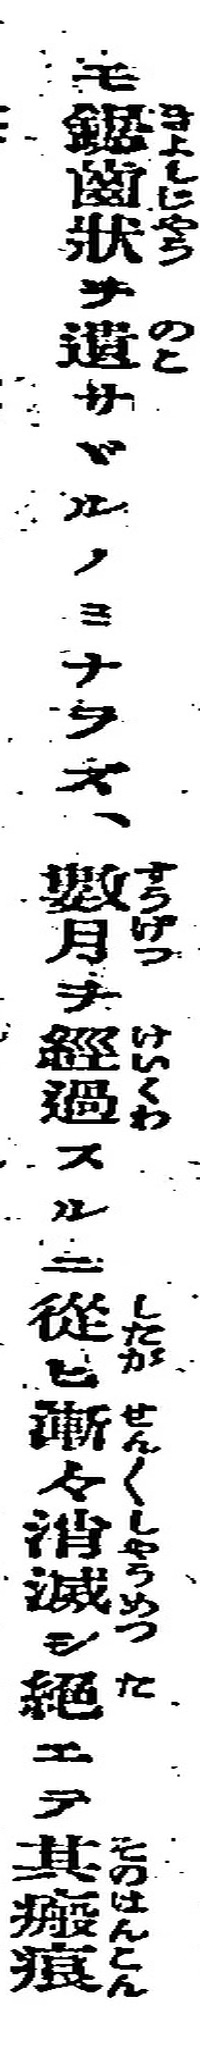モ鋸歯状ヲ遺サヾルノミナラズ、数月ヲ経過スルニ従ヒ漸々消滅シ絶エテ其瘢痕
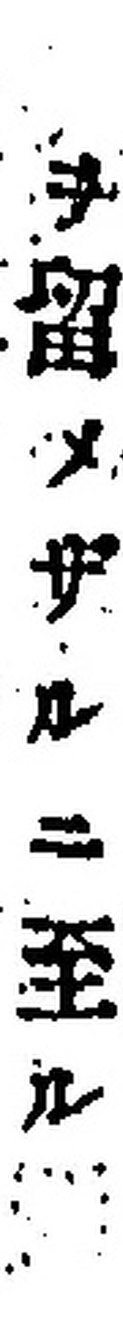ヲ留メザルニ至ル
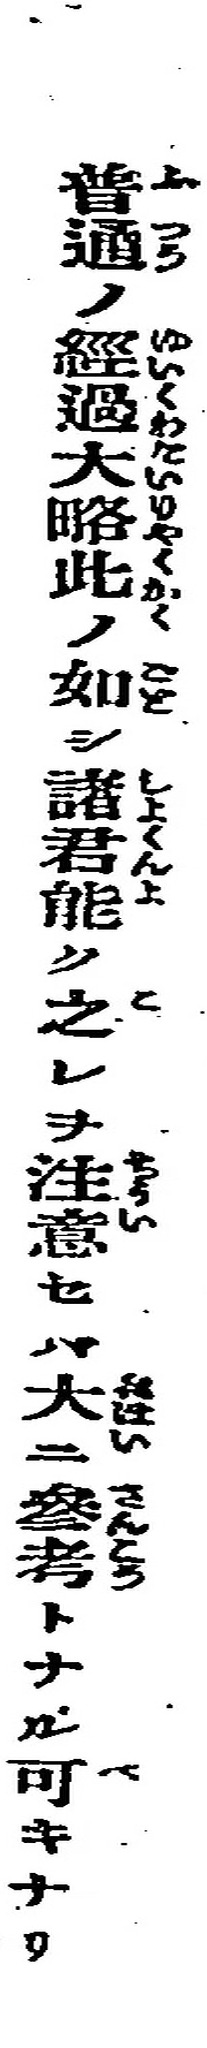普通ノ経過大略此ノ如シ諸君能ク之レヲ注意セバ大ニ参考トナル可キナリ

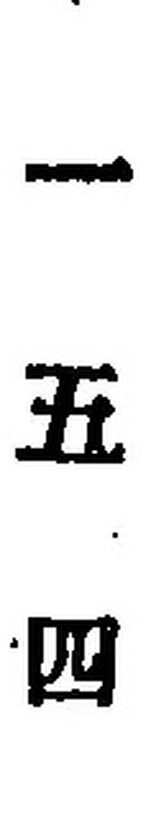一五四

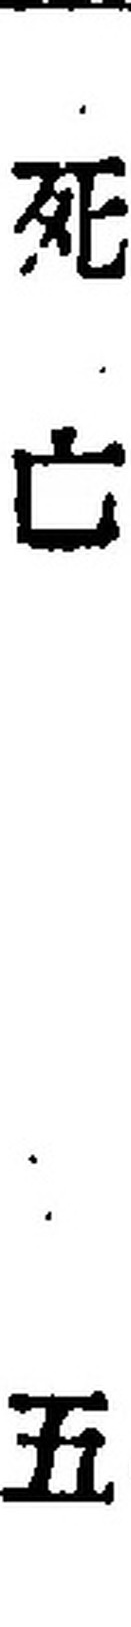死亡五
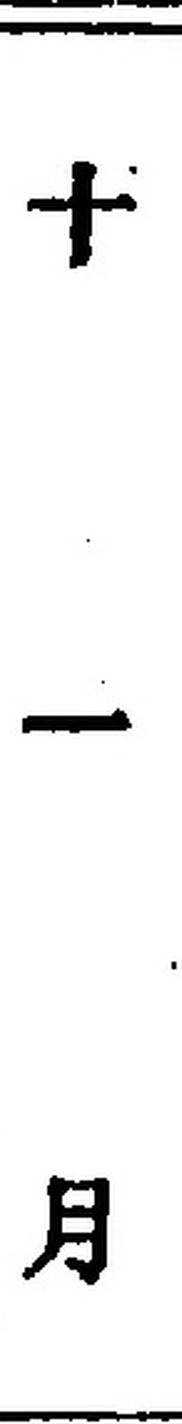十一月
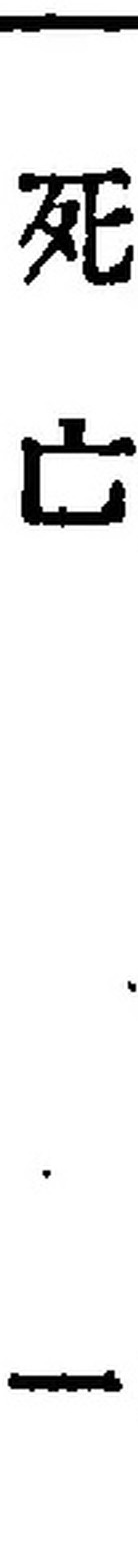死亡一
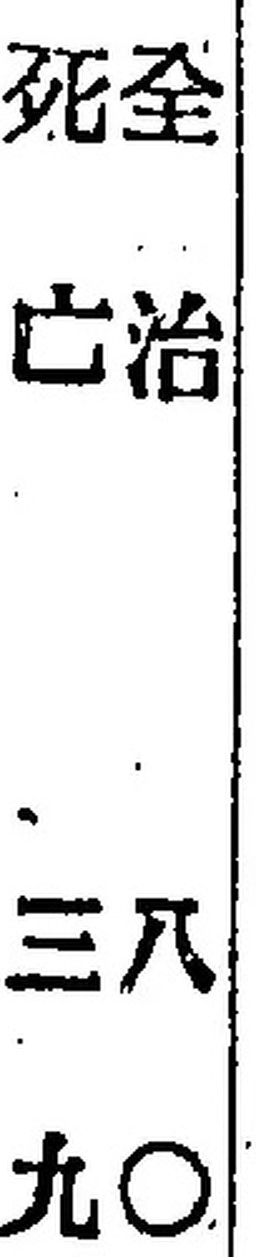死亡三九

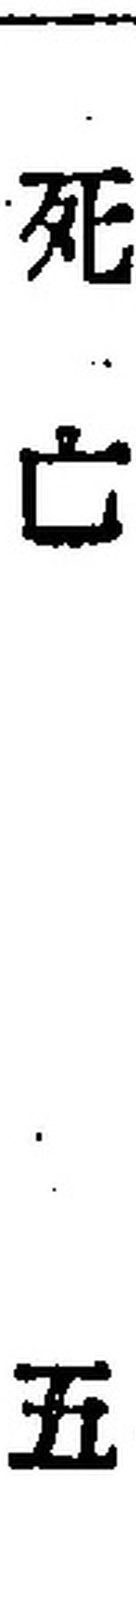死亡五
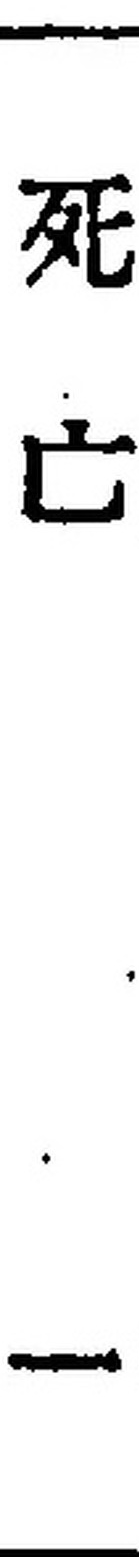死亡一
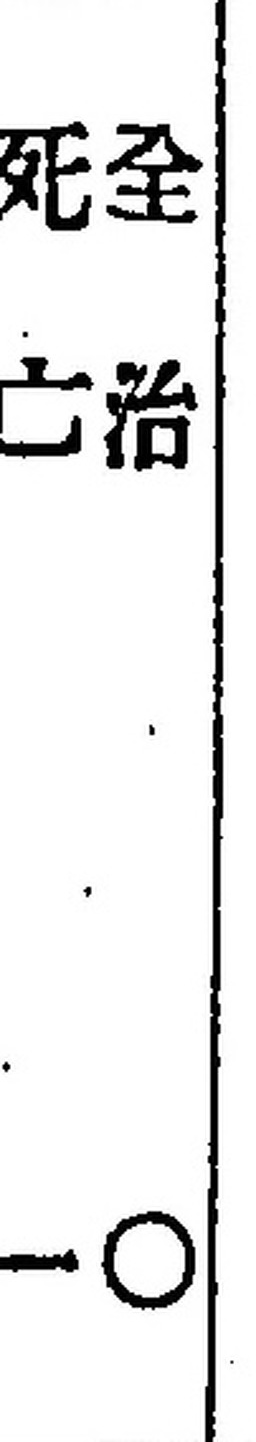死亡一
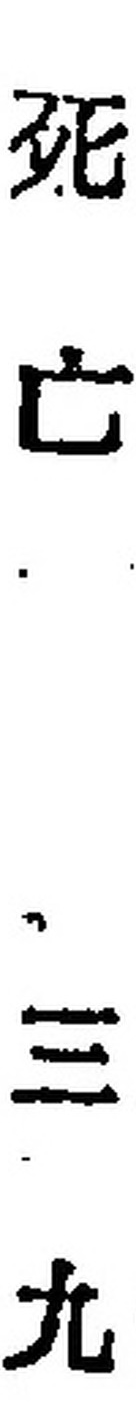死亡三九
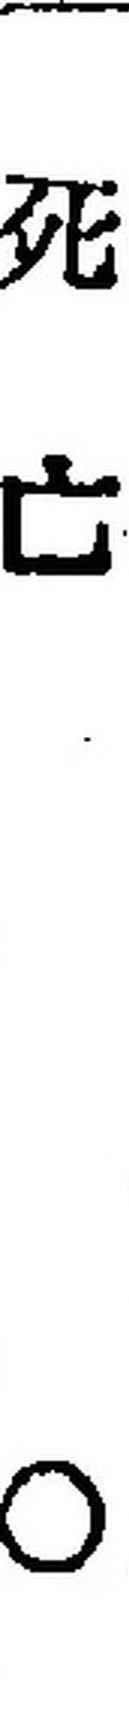死亡五

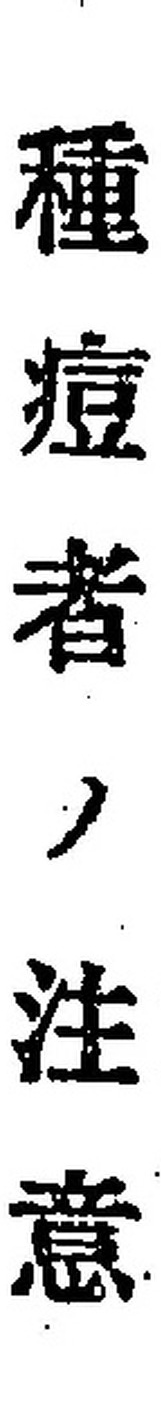種痘者ノ注意
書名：天然痘予防注意兼種痘者之注意
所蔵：国立国会図書館 National Diet Library, JAPAN
